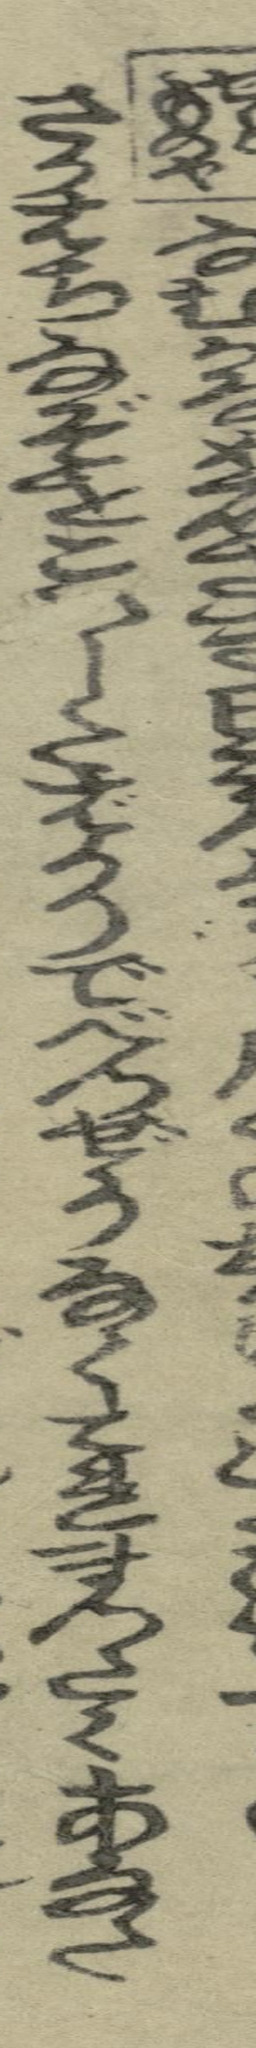さかはちなぞをこはしたばかりでべつぜうなくこれまつたくあなた
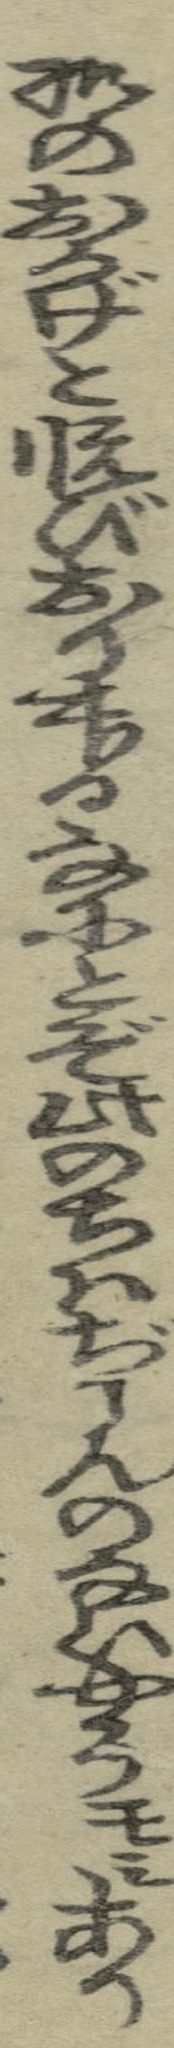様のおかげと悦びおり升るなにとぞ此のちはぢしんのないやうモシあり
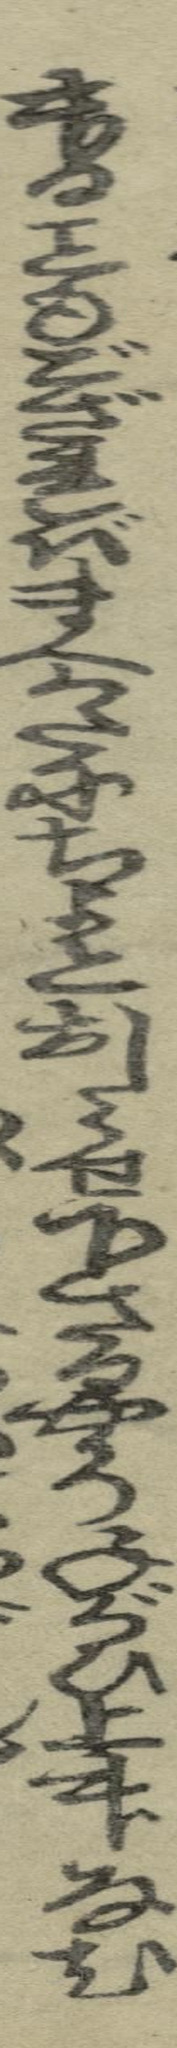升ることもござればまへかたにちよとおしらせ下さるやうねがひ上升なむ
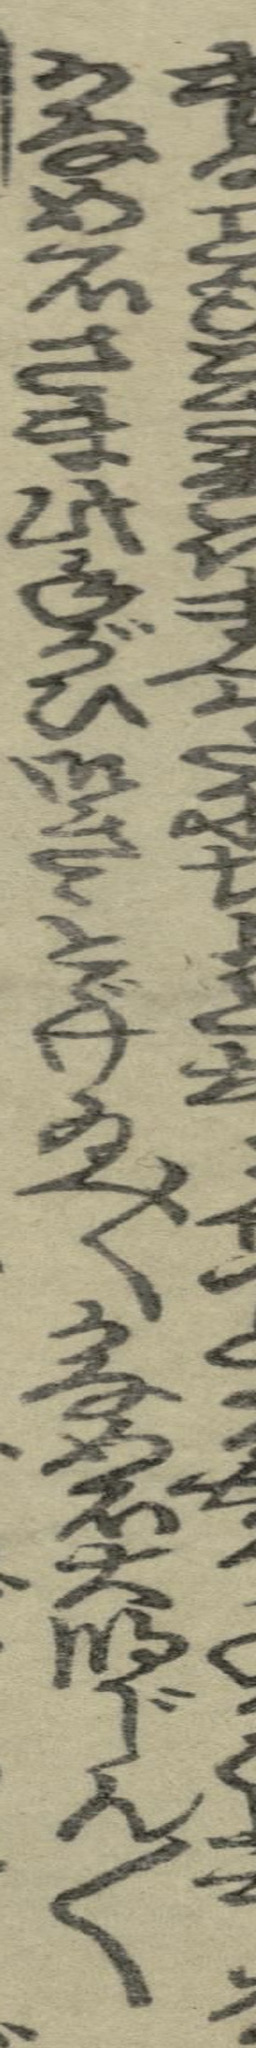かなめ石さま此ねがひ御きゝとゞけ給へ〳〵かなめ石大明じん〳〵
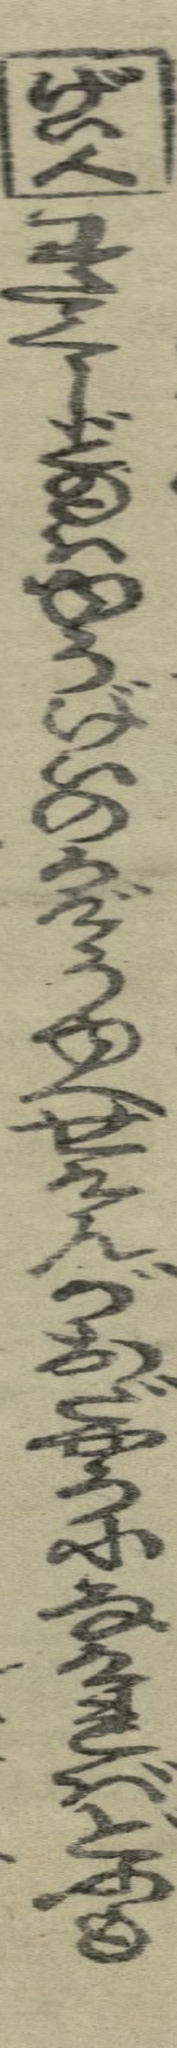げい人わたくしどもはゆうげいのかげうゆへせけんがおだやかになければどふも
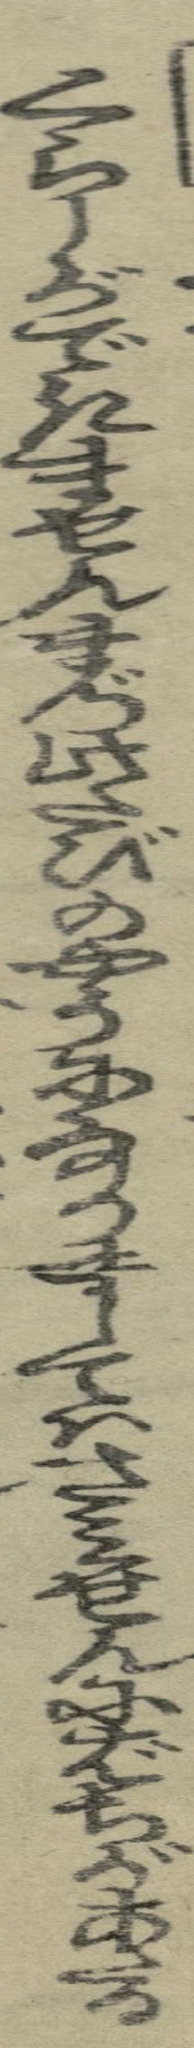くらしができませんまづ此たびのやうになりましてはさみせんにばちがあたる
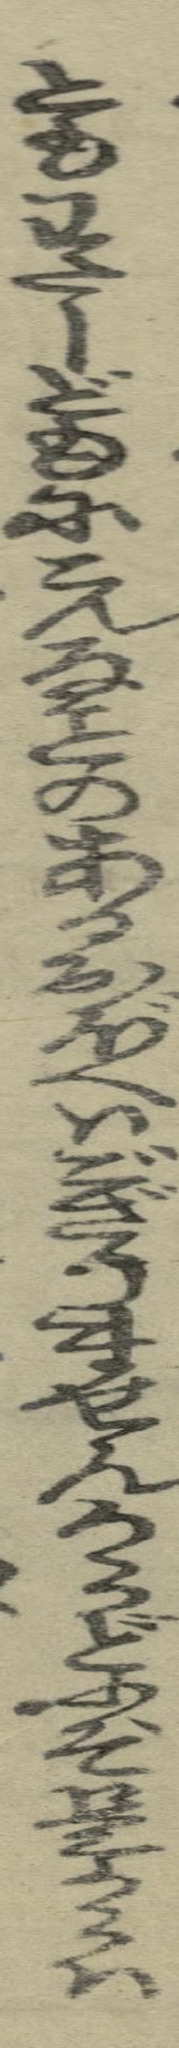ともわたしどもにこんなことのあるおぼへはござりませんからどふぞ是からは
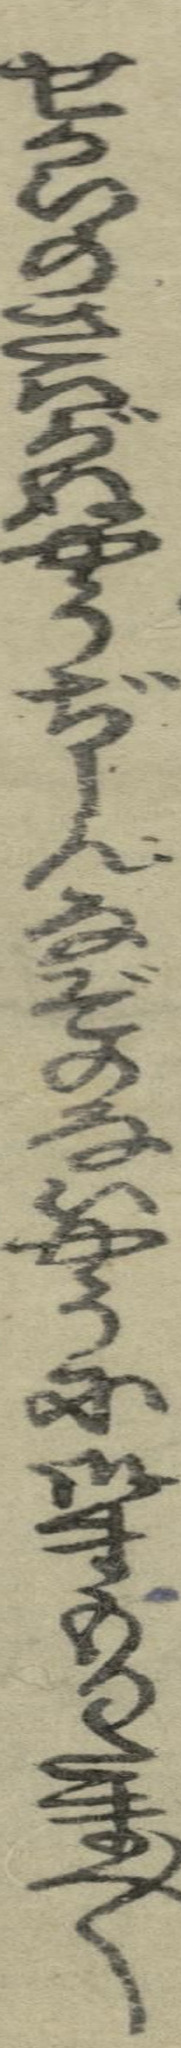せかいのさはがぬやうぢしんなぞのないやうに御まもりたまへ〳〵
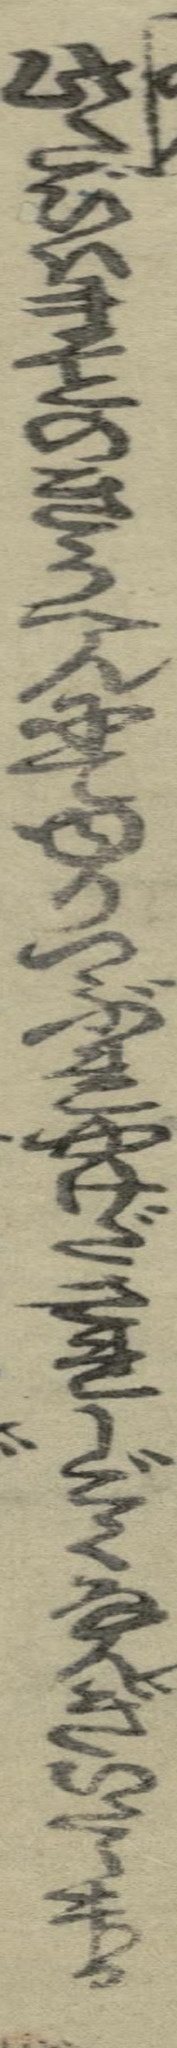此たびはまことのきうへんにてゆりつぶれやけだされしごくなんぎいたし升る
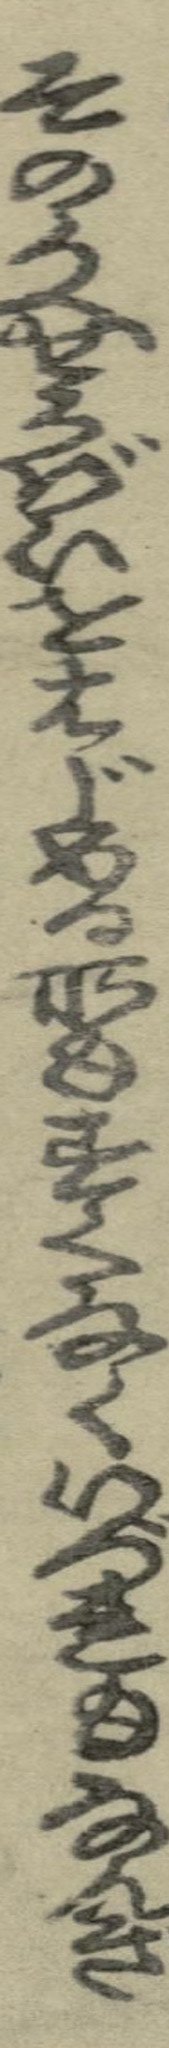そのうへせうばいをはじめる所もすくなくいづれもなんぎ
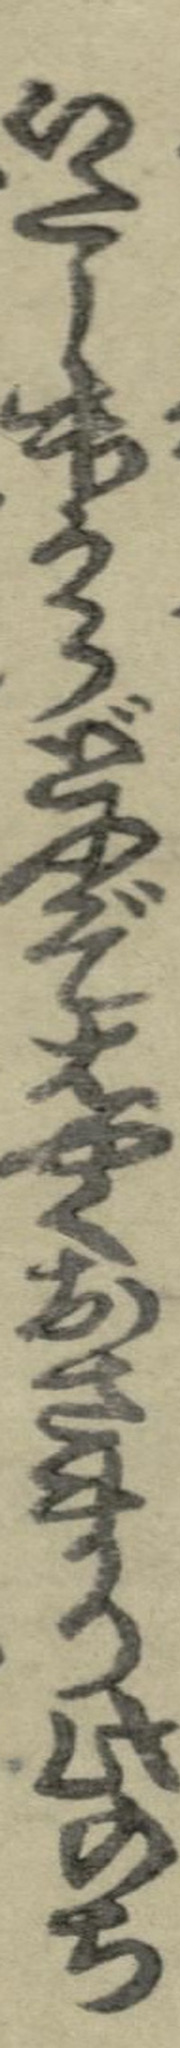いたし升からどふぞはやくおさまり此のち
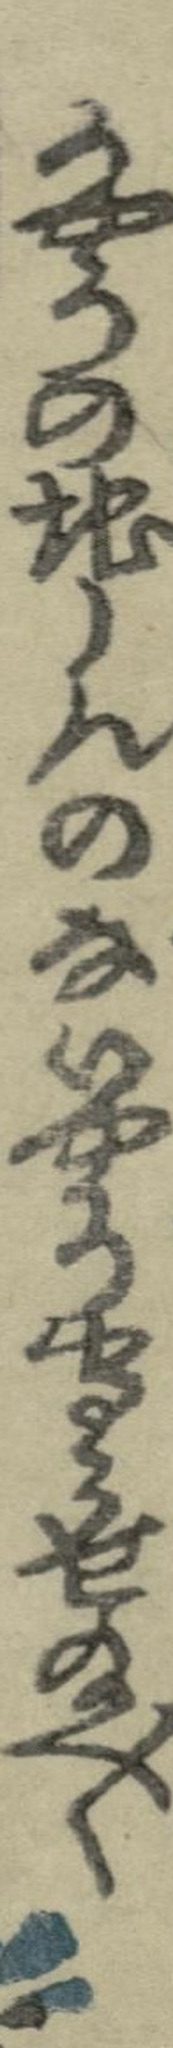かやうの地しんのないやう守らせ給へ〳〵
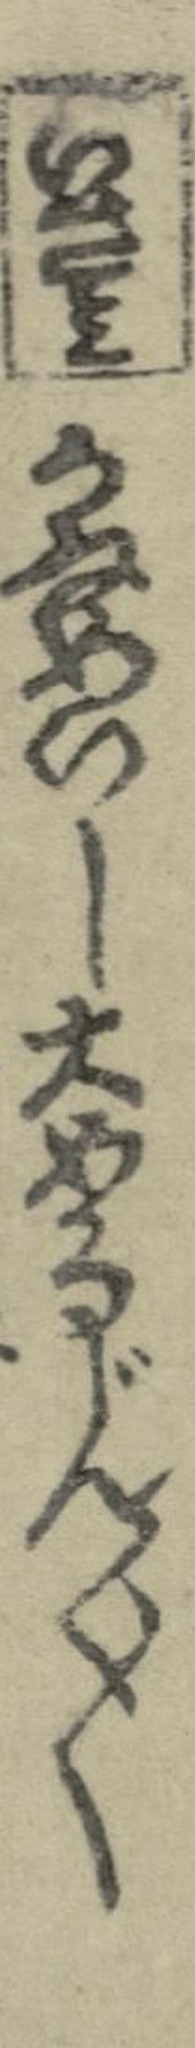いさみかなめいし大めうじん〳〵〳〵
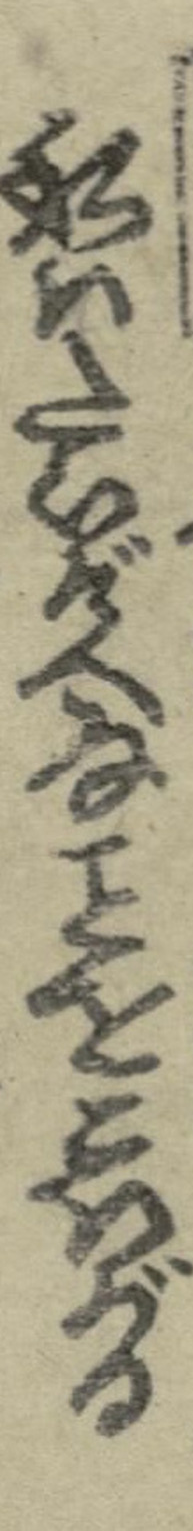私はたいげへなことをこはがる
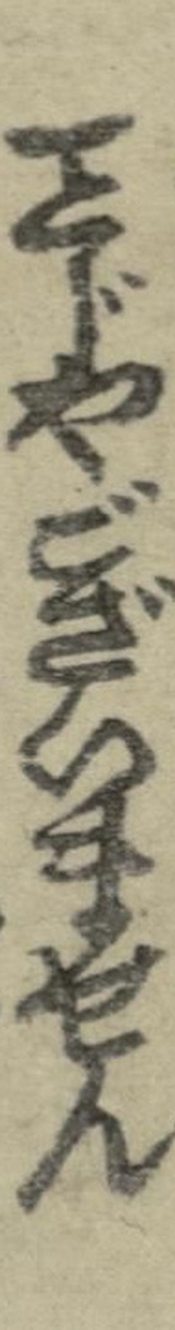ことじやございません
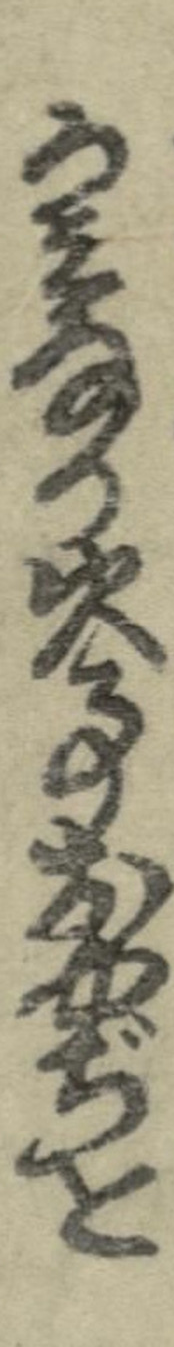かみなり火事おやぢと
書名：あんしん要石
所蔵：東京大学地震研究所図書室 Earthquake Research Institute Library, The University of Tokyo, JAPAN
